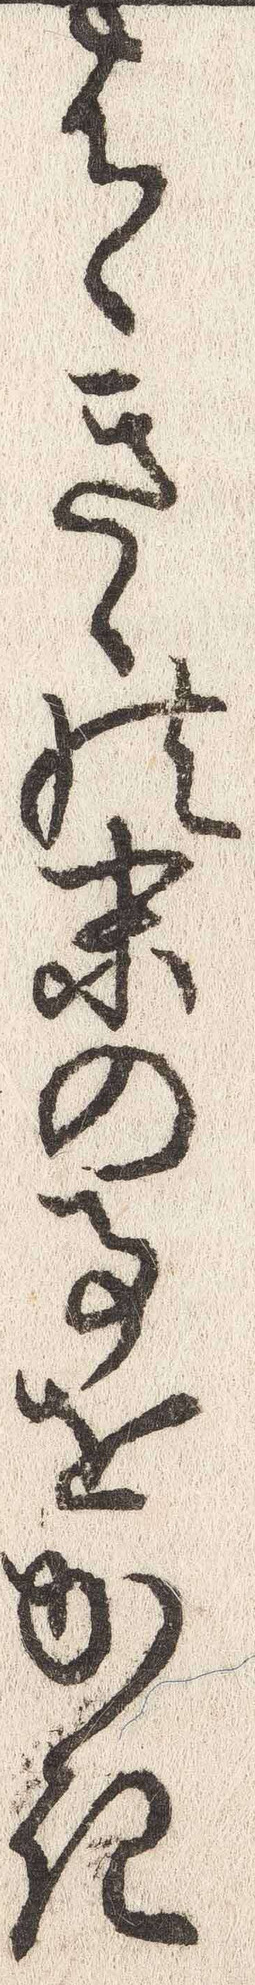はゝきゝの末の事をかき
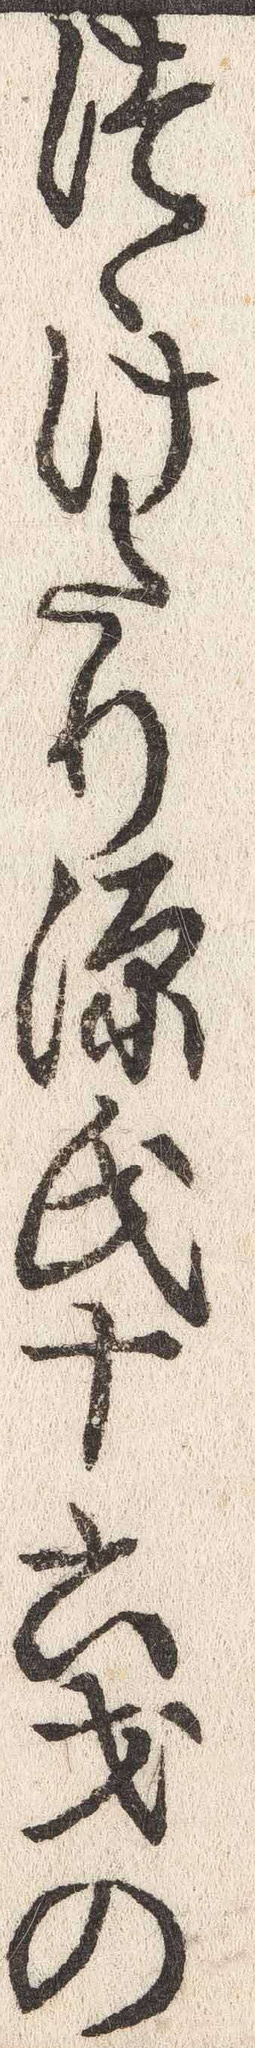つゝけたり源氏十六才の
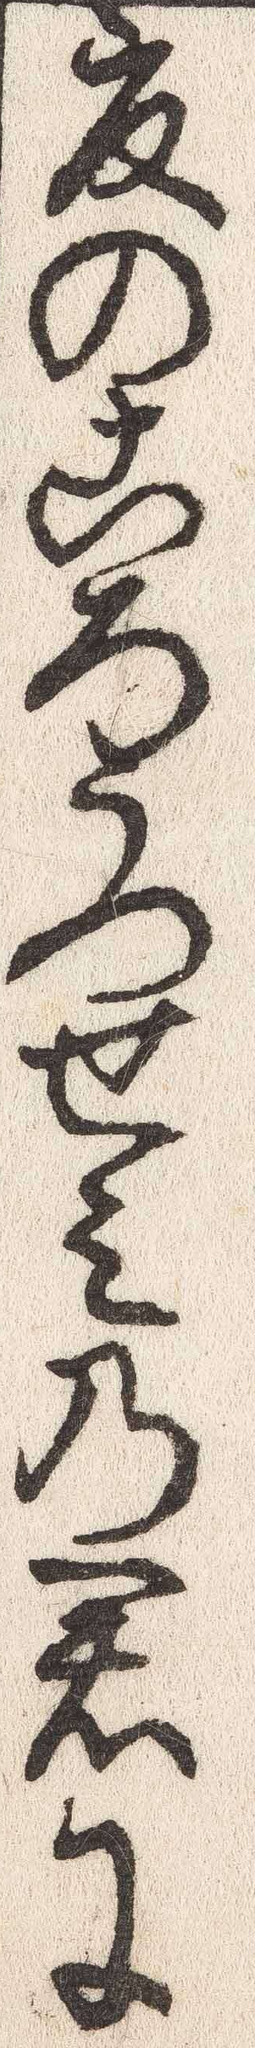夏のころうつせみの君に
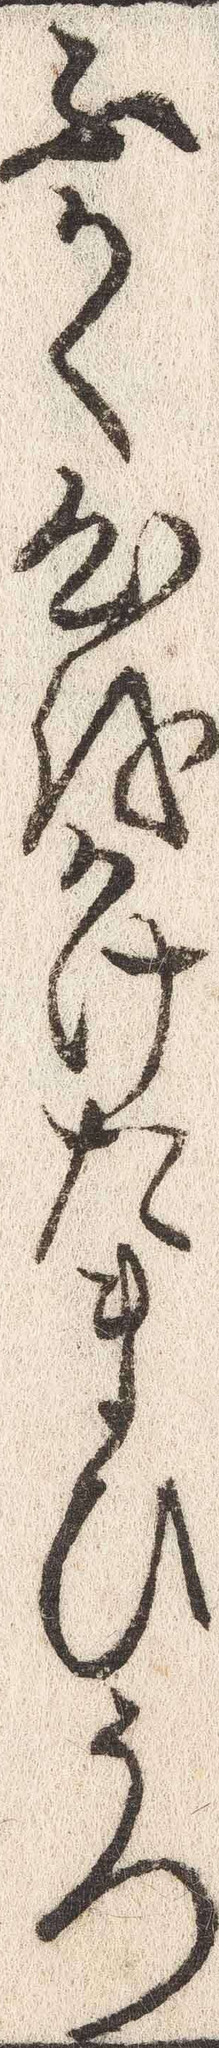ふかく心をかけたまひうつ
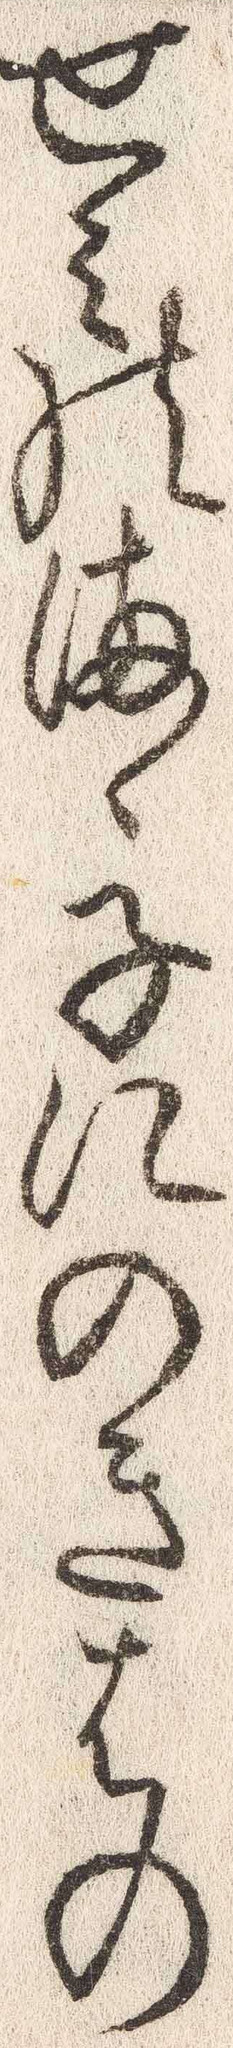せみのまゝ子にのきはの
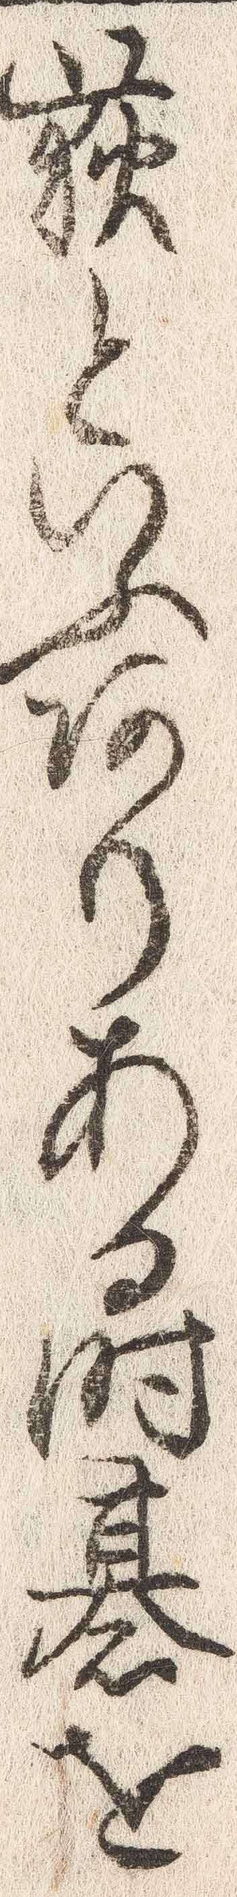荻といふありある時碁を
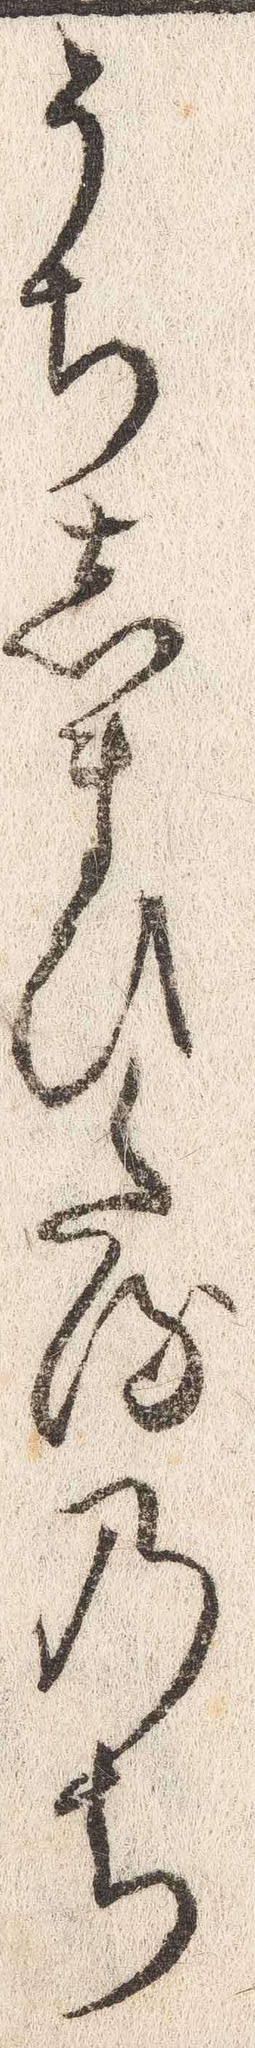うちしまひたるのち
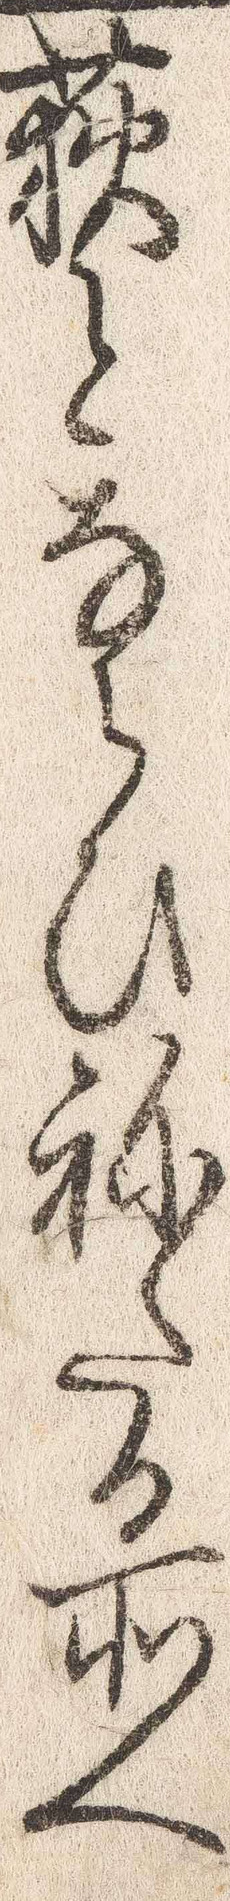荻とならひねたる所へ

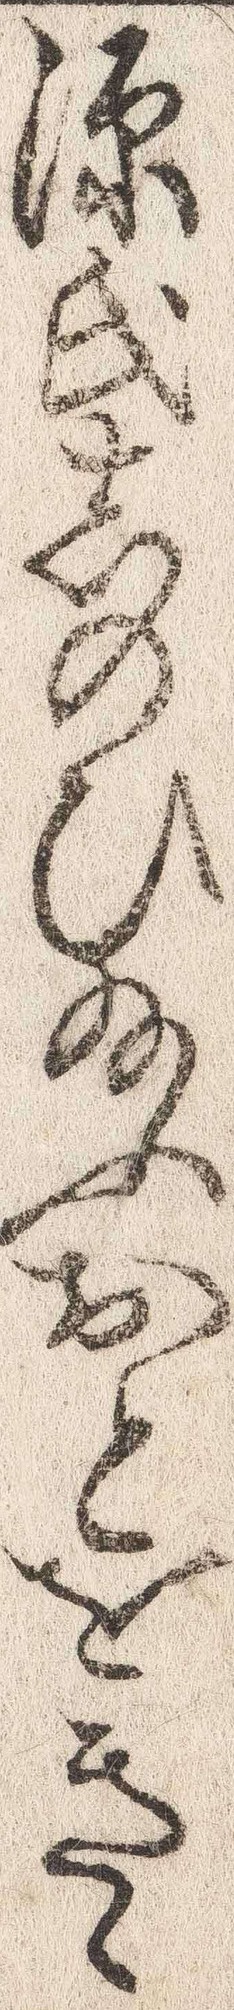源氏しのひ給ふおとをきゝ
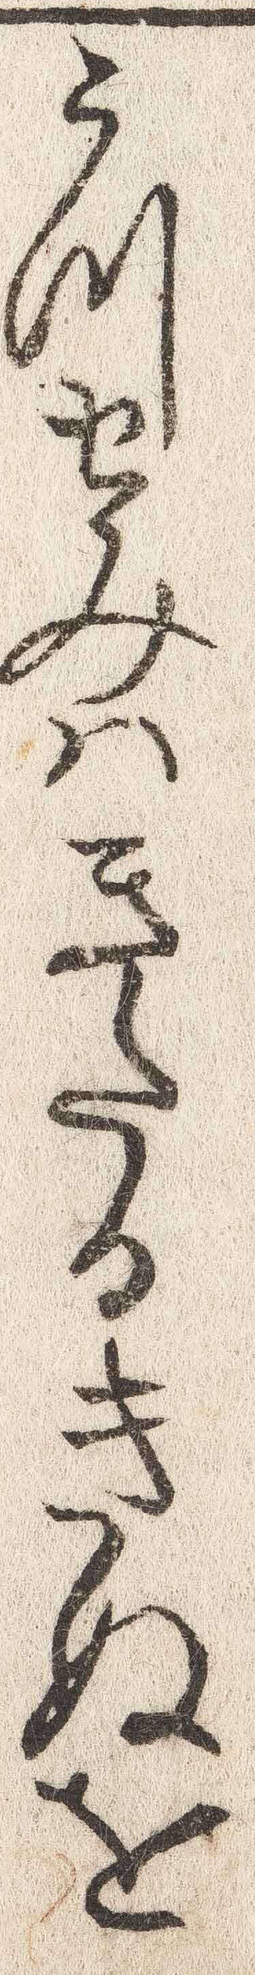うつせみはきたるきぬを
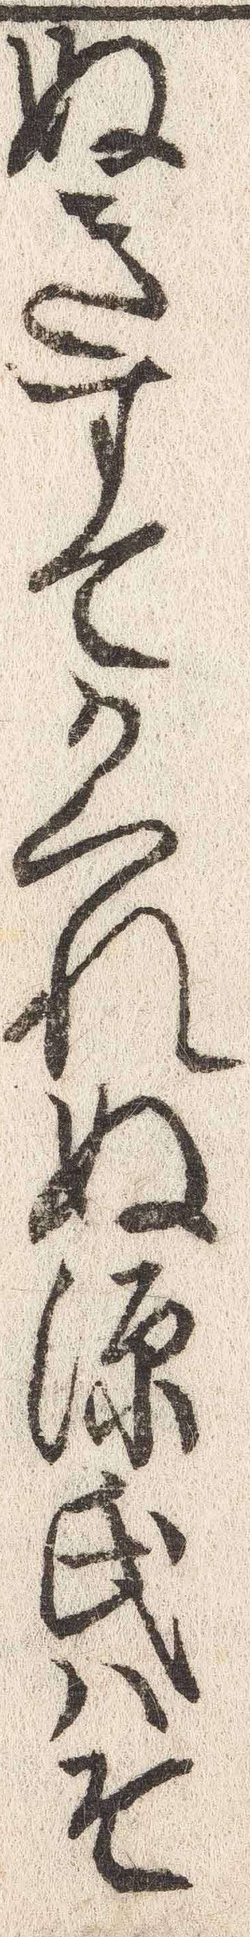ぬきすてかくれぬ源氏はそ
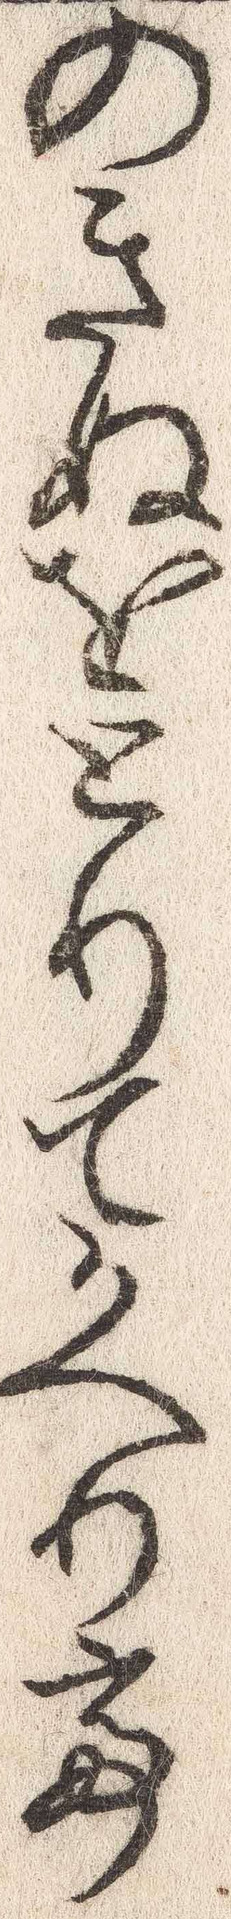のきぬをとりてかへりて
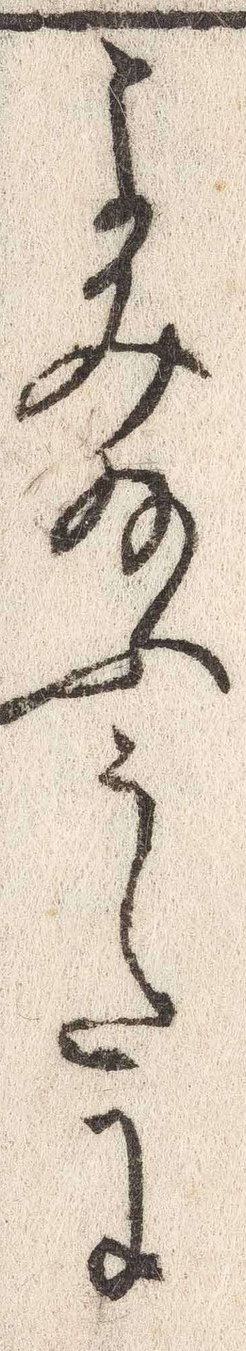よみ給ふうたに
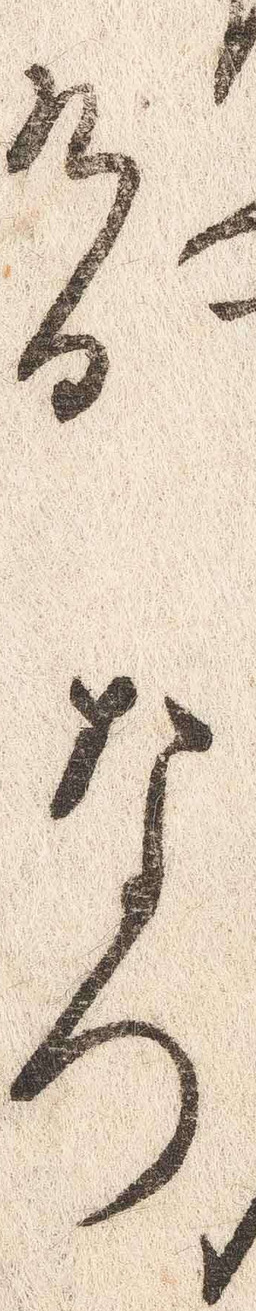けるなつ

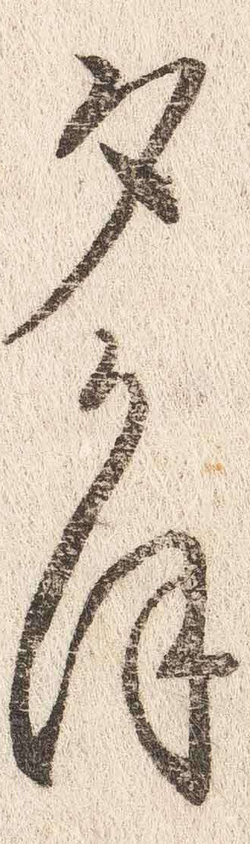夕かほ
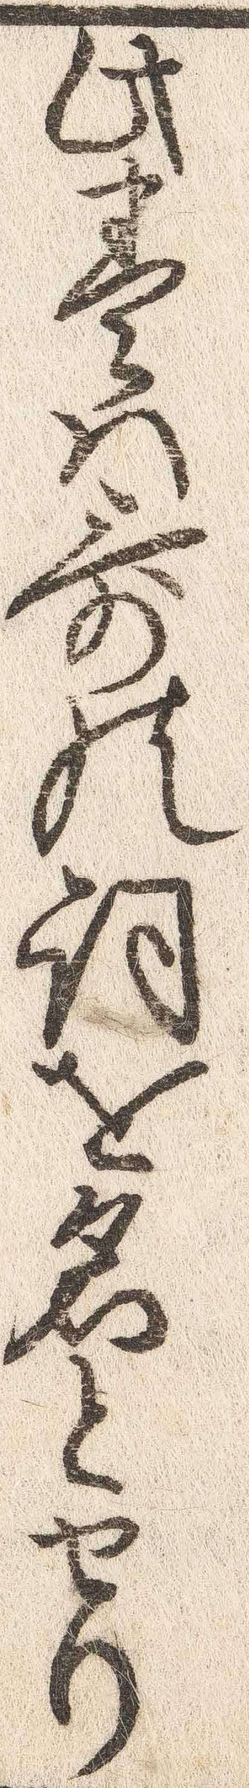此巻は歌の詞を名とせり
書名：源氏物語
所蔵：東京学芸大学附属図書館 国文学研究資料館
